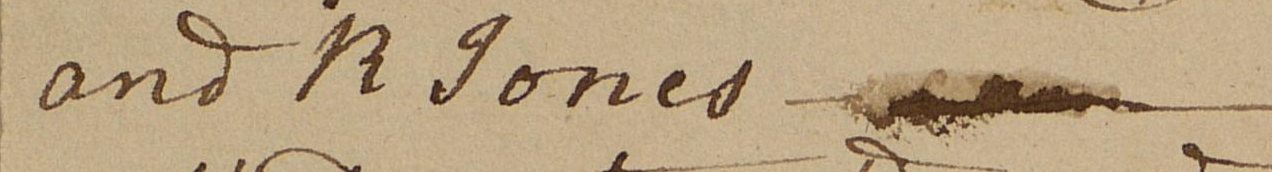and R Jones-
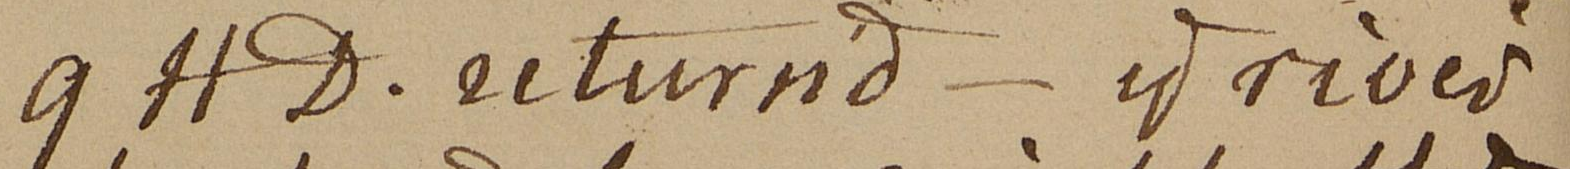9 HD. return'd- y^e river
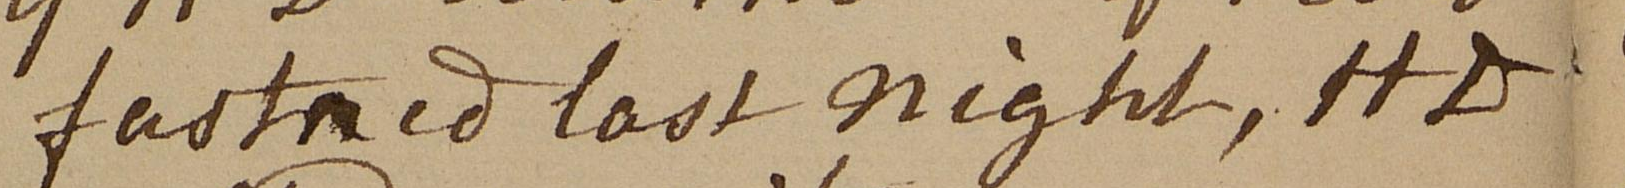fastned last night, HD
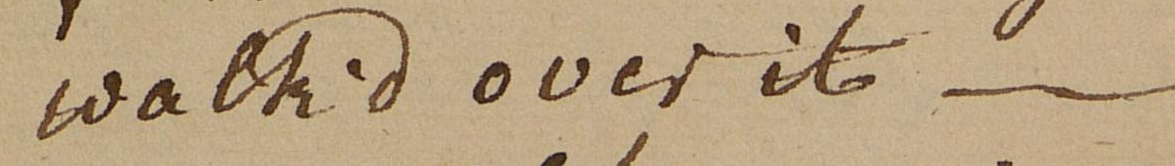walk'd over it-
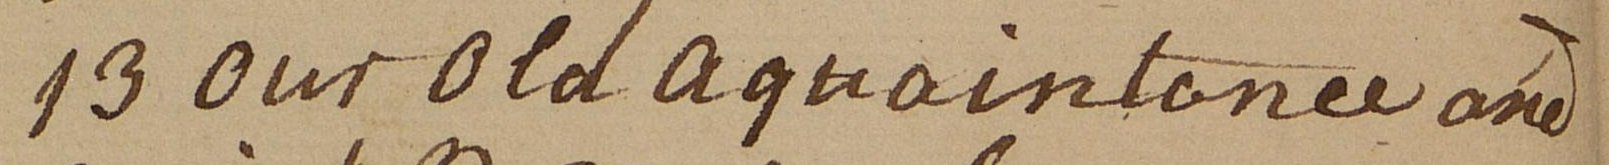13 our Old aquaintance and
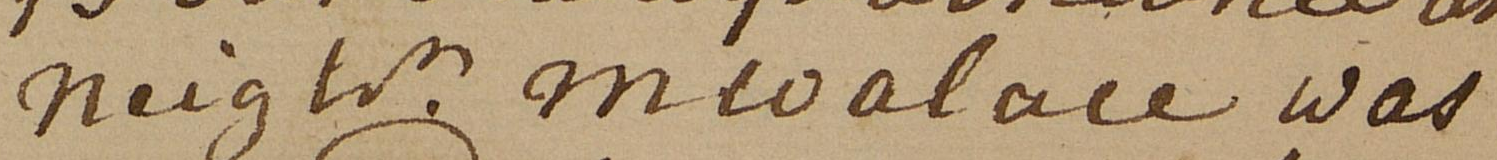Neigh^r. M Walace was
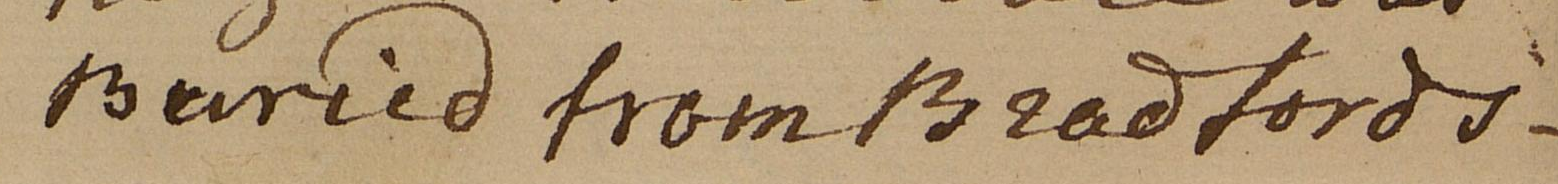Buried from Bradfords-
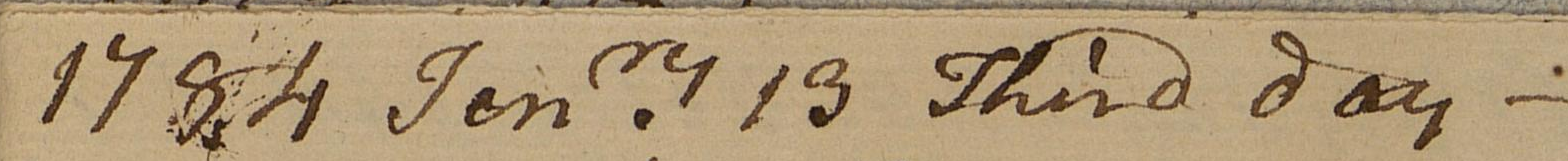1784 Jen^ry. 13 Third day-
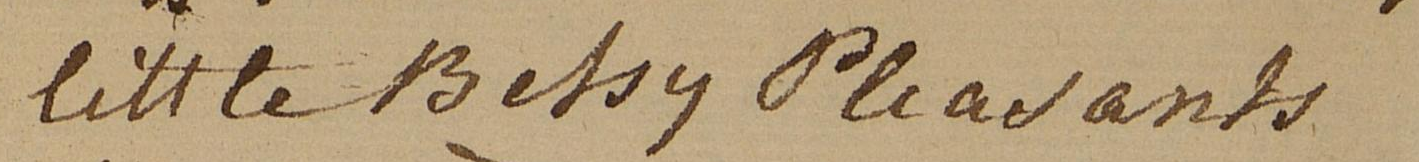little Betsy Pleasants
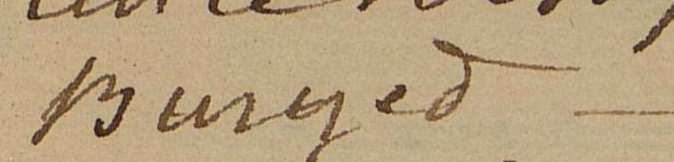Buryed-
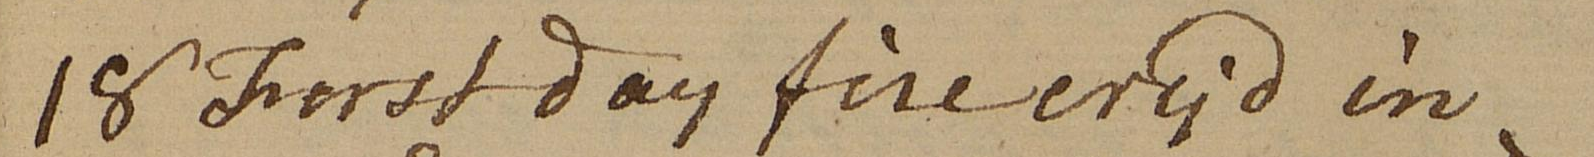18 First day fire cry'd in
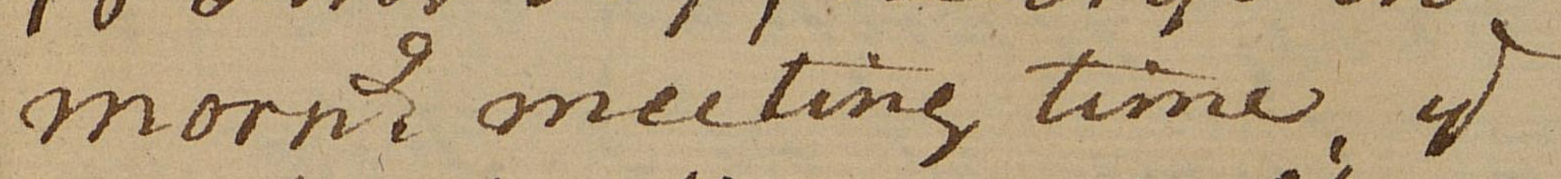Morn^g. meeting time, y^e
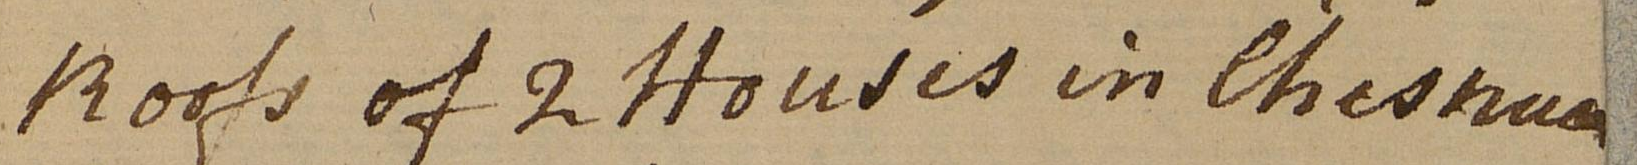Roofs of 2 Houses in Chesnut
